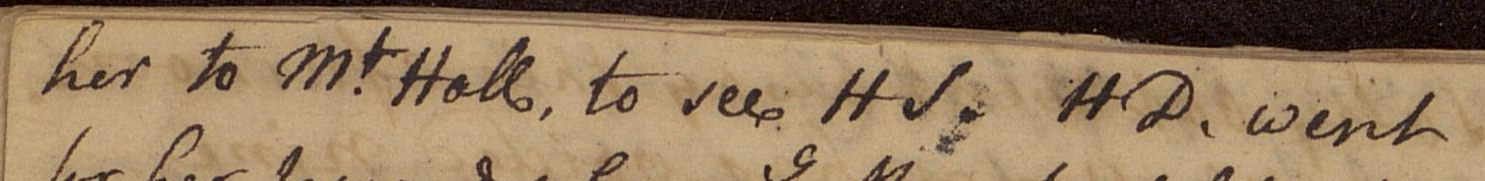her to M^t. Hall, to see HS. HD. went
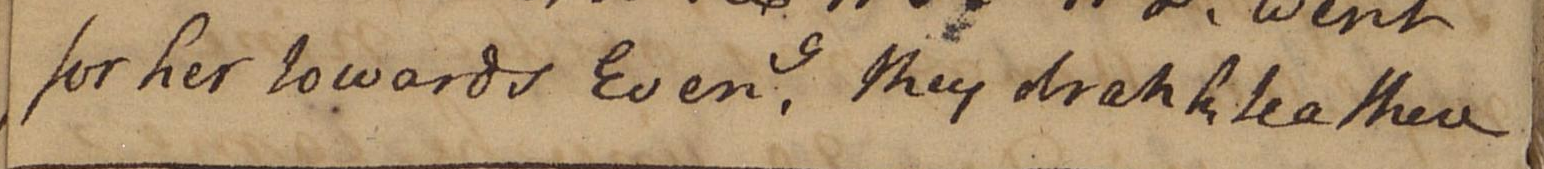for her towards Even^g, they drank tea there
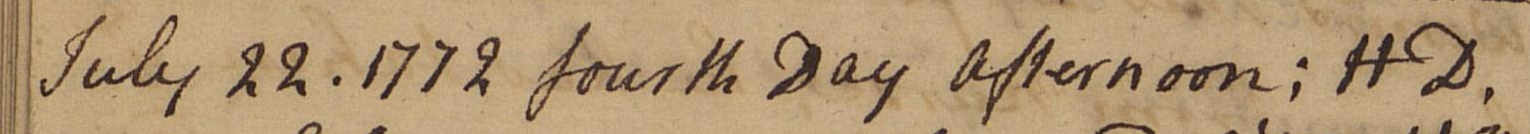July 22. 1772 fourth day Afternoon; HD.
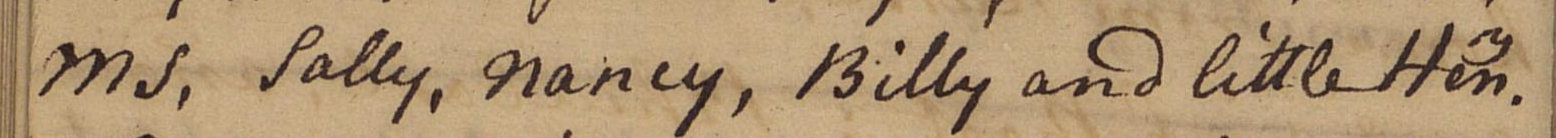MS. Sally, Nancy, Billy and little Hen^ry.
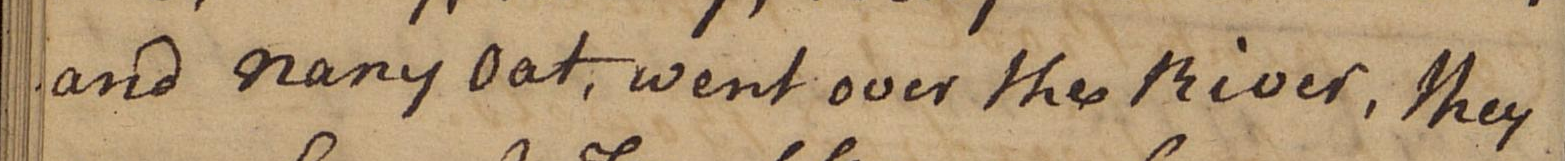and Nany Oat, went over the River, they
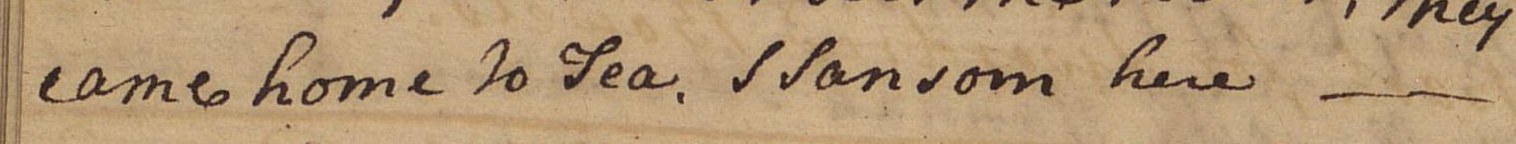came home to Tea, S Sansom here-
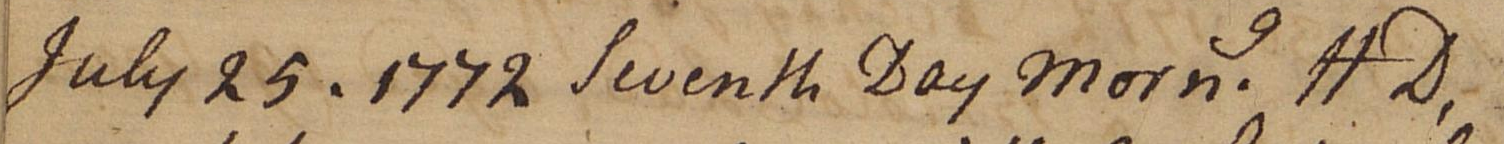July 25. 1772 Seventh Day Morn^g. H ,
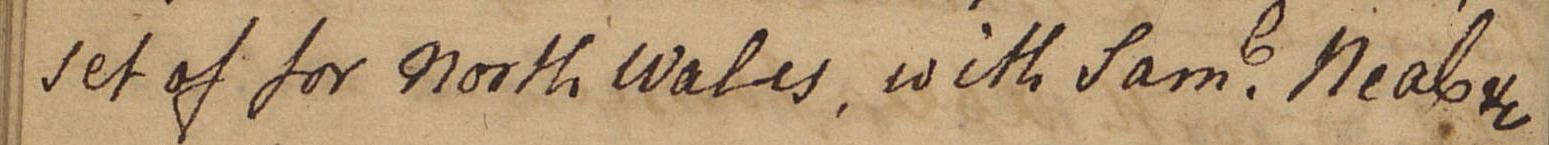set of for North Wales, with Sam^l. Neal &c
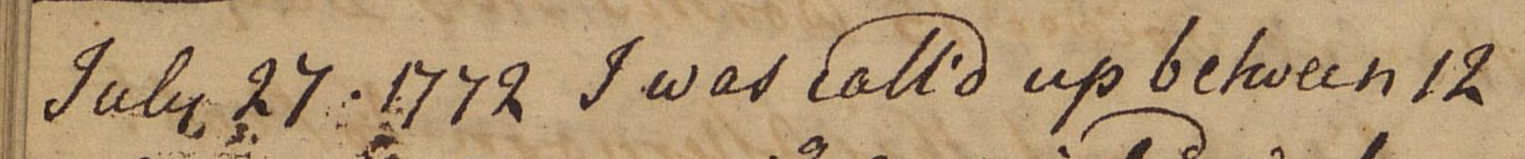July 27. 1772 I was call'd up between 12
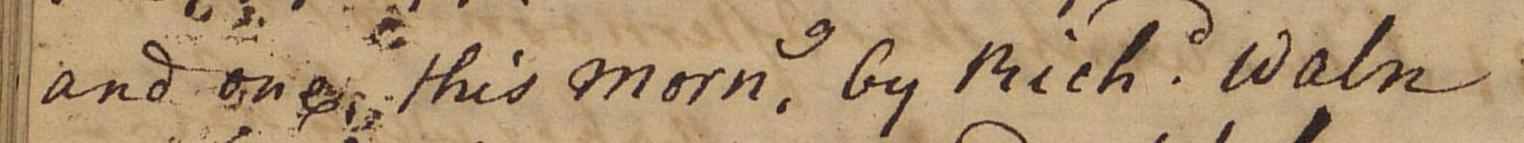and one, this morn^g, by Rich^d. Waln
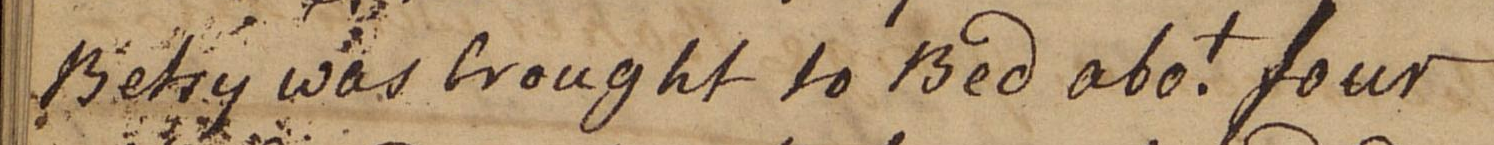Betsy was brought to Bed abo^t. four
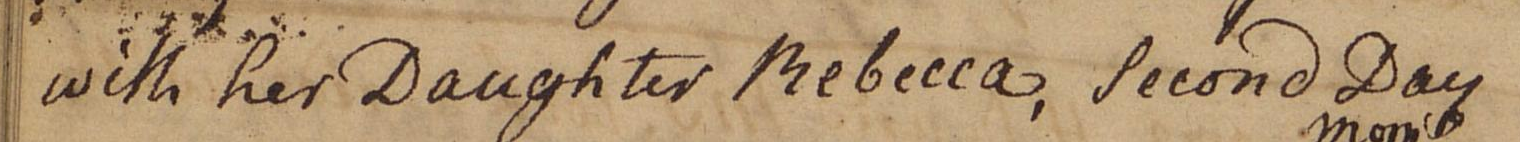with her Daughter Rebecca, Second Day
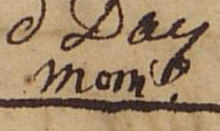morn^g.
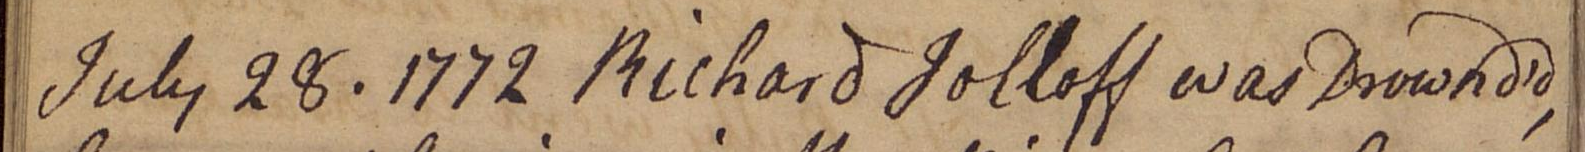July 28. 1772 Richard Jolloff was Drownd'd,
